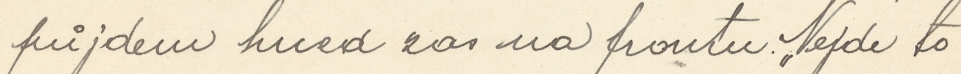půjdem hned zas na frontu. „Nejde to
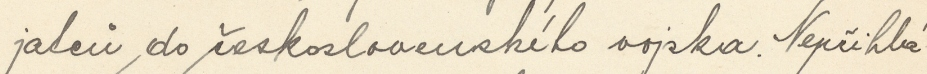jatců do československého vojska. Nepřihlá-
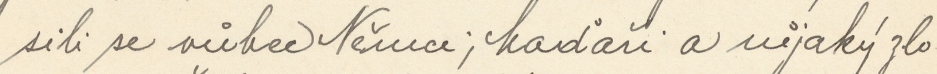sili se vůbec Němci, Maďaři a nějaký zlo-
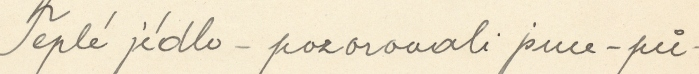Teplé jídlo - pozorovali jsme - pů-
